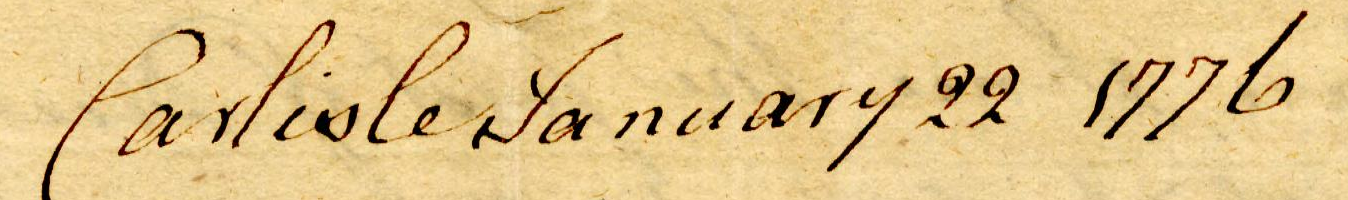Carlisle January 22 1776
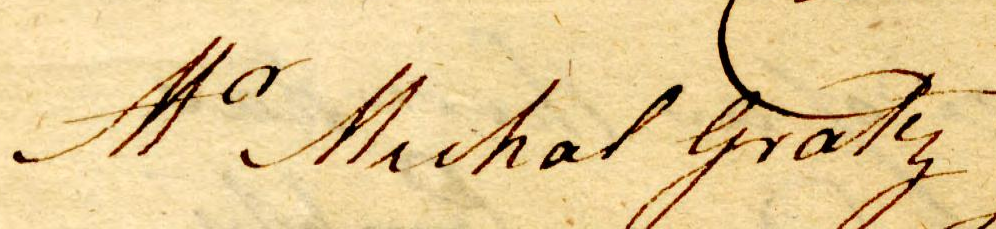M^r Michal Gratz
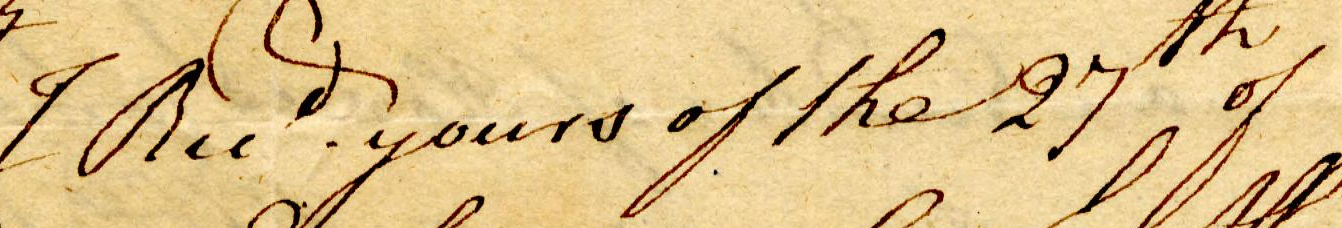I Rec^d yours of the 27^th of
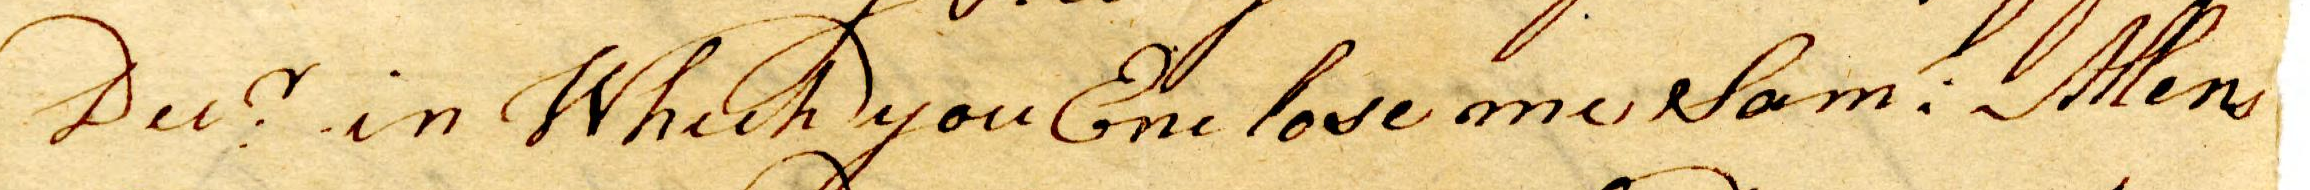Dec^r: in Which you Enclose me Sam^l: Allens
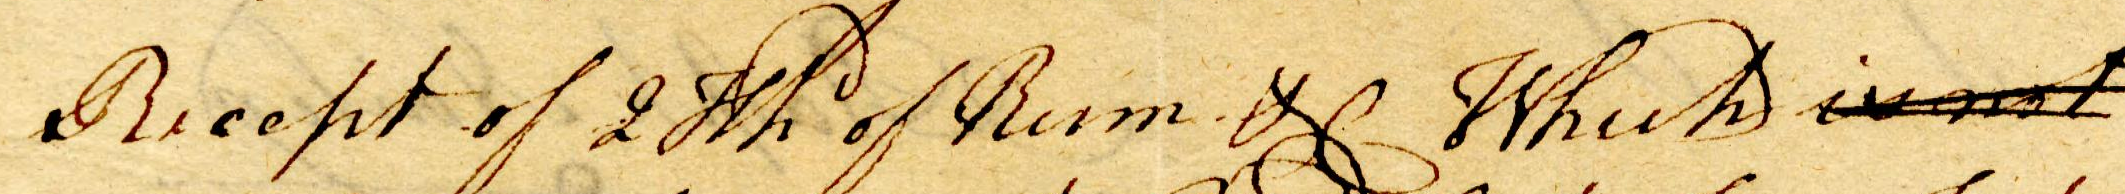Recept of 2 Hh^d of Rum &c Which [is not]
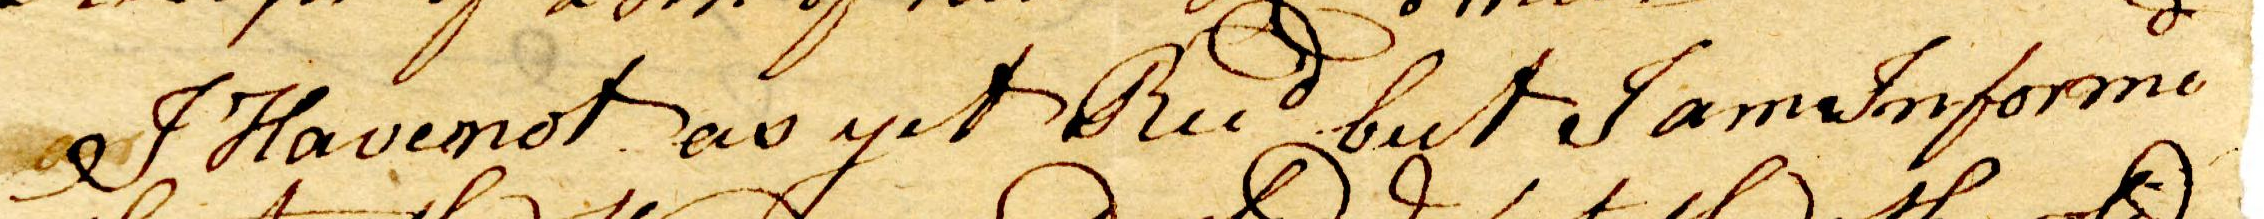I Have not as yet Rec^d but I am Informe
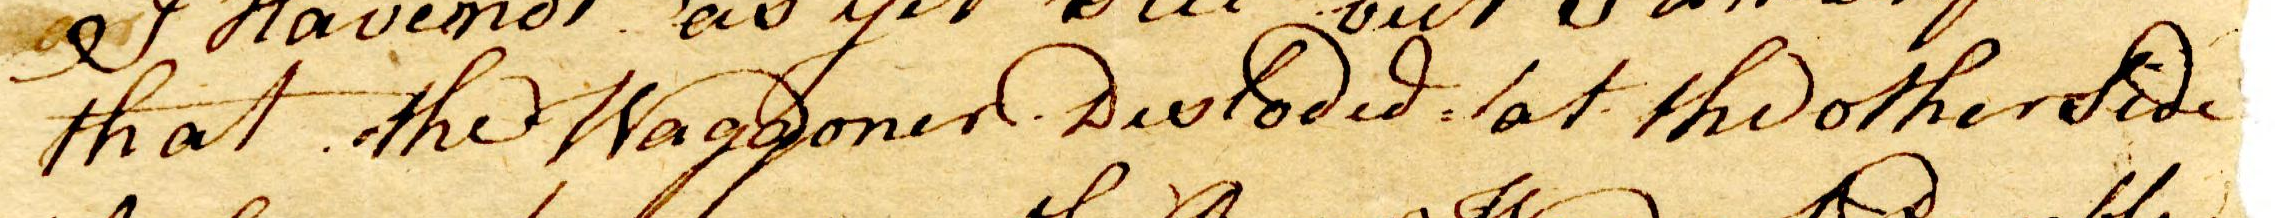that. the Waggoner Disloded at the other side
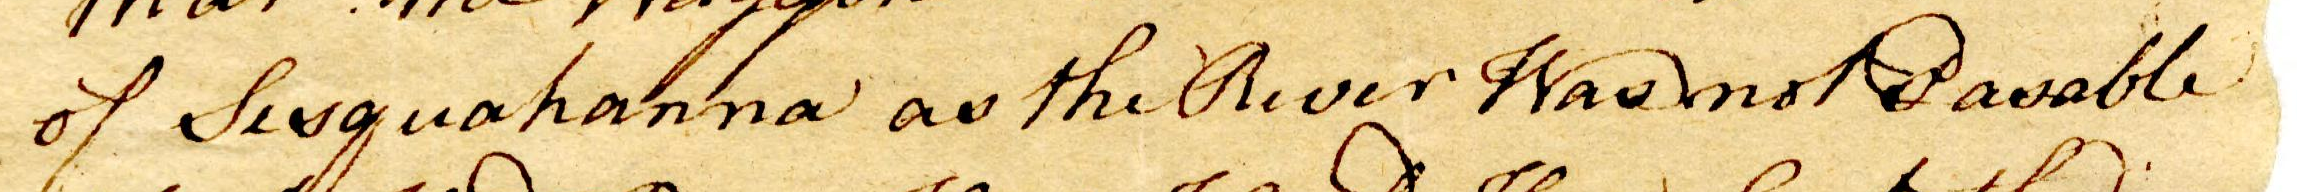of Sesquahanna as the River Was not Pasable
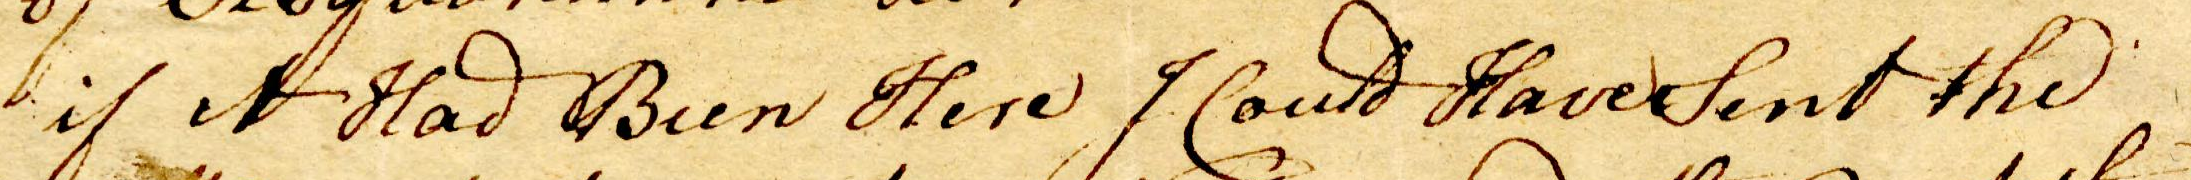if it Had Been Here & Could Have Sent the
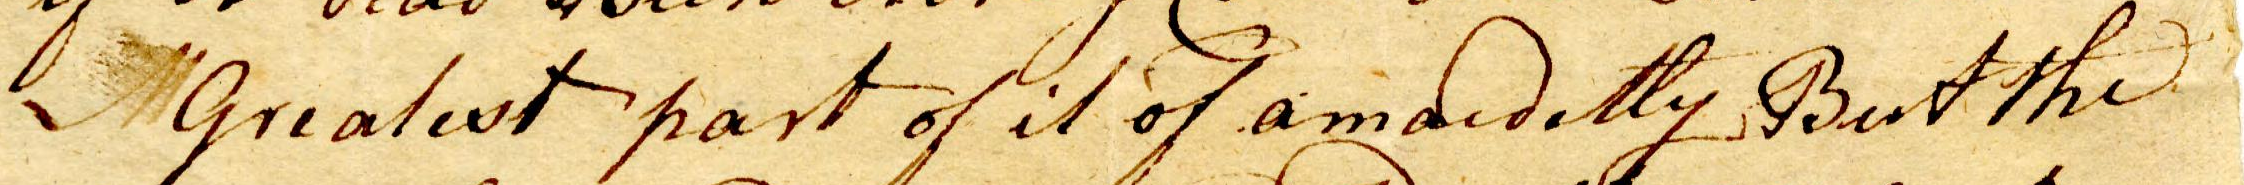Greatest part of it of amaiditly But the
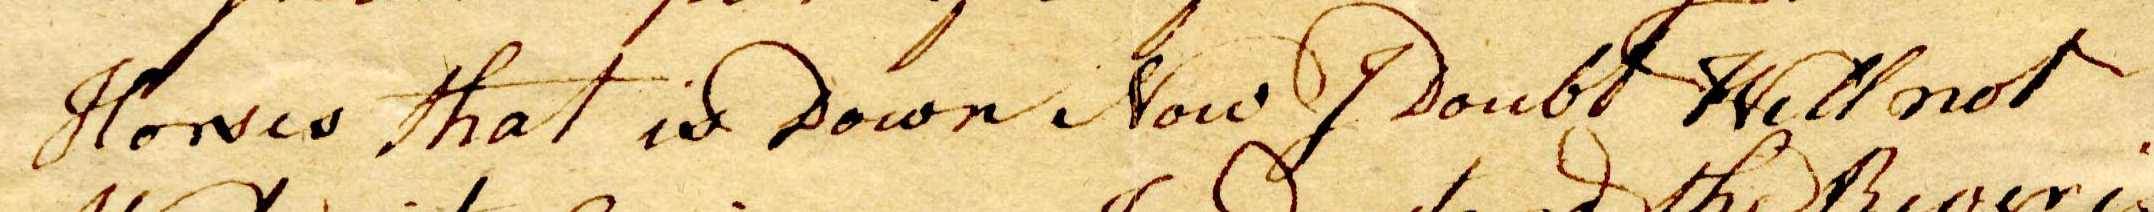Horses that is Fown Now I Foubt well not
